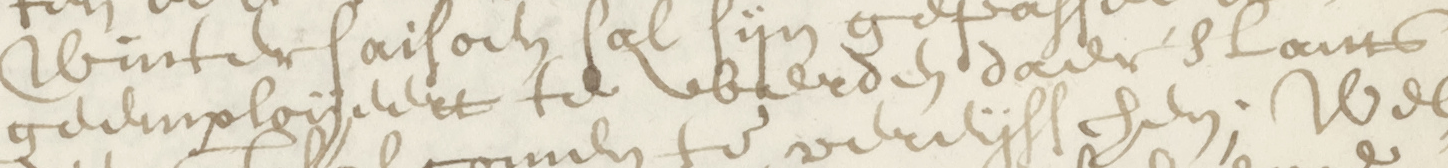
geemploijeert te werden daer 's Lants
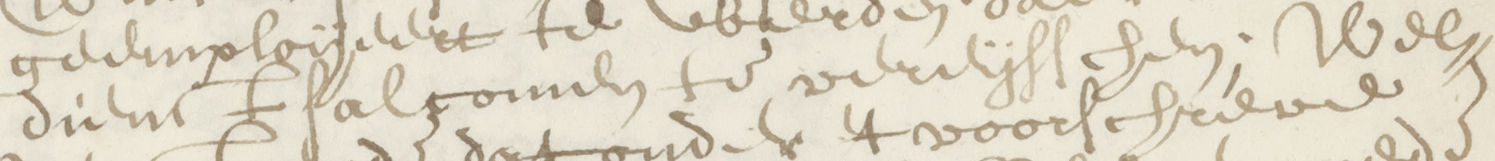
dienst sal comen te vereijsschen; Wel,,
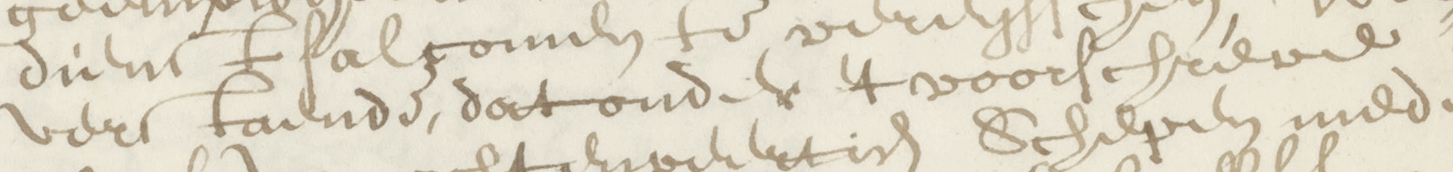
verstaende, dat onder 't voorschreve
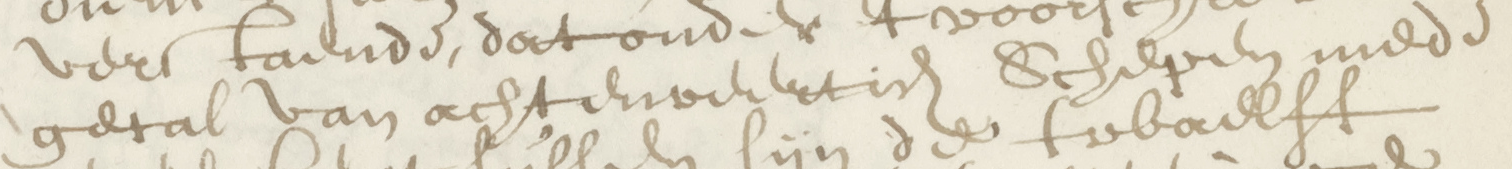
getal van achtenveertich Schepen mede
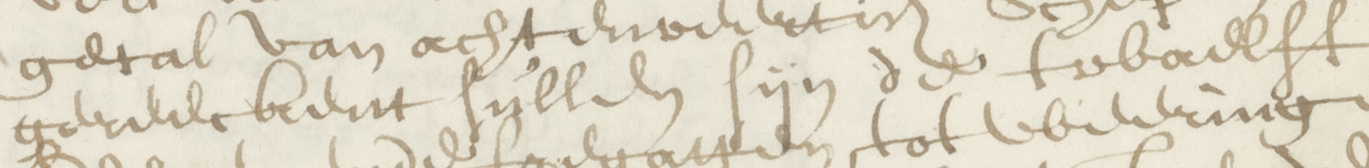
gereeckent sullen sijn de twaelff
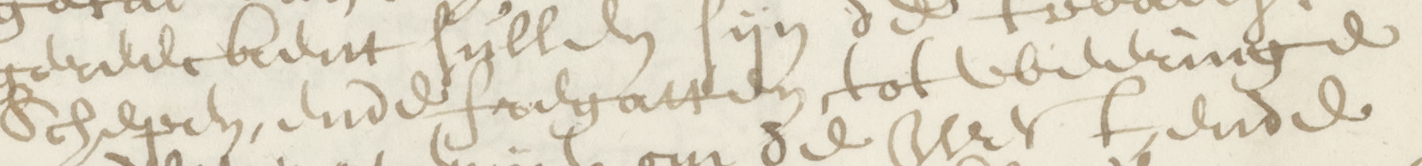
Schepen, ende fregatten, tot weeringe
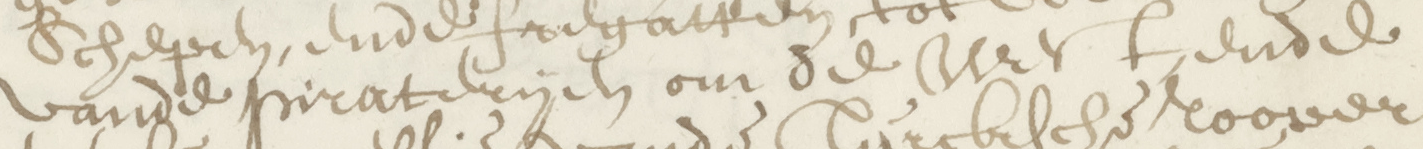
vande piraterijen om de West, ende
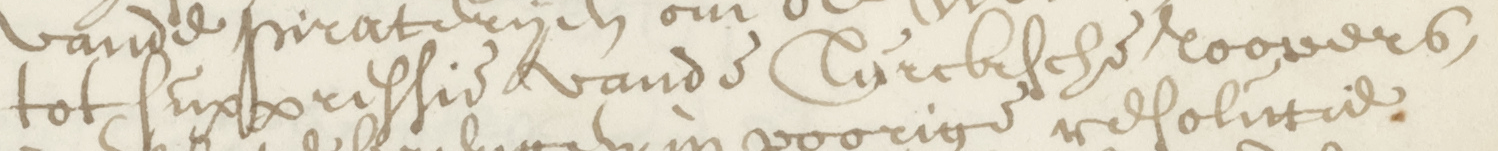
tot suppressie vande Turcksche roovers,
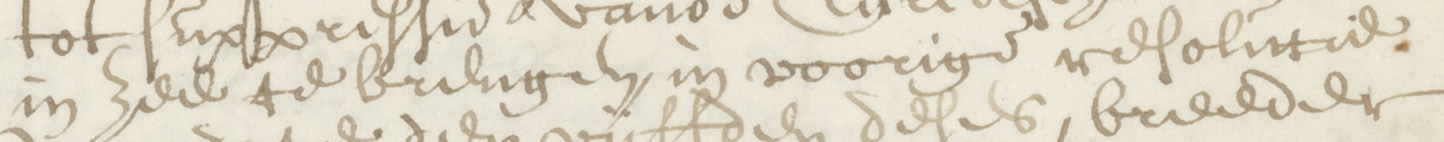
in zee te brengen, in voorige resolutie
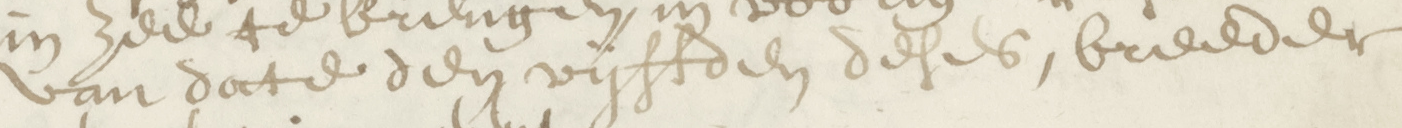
van date den vijffden deses, breeder
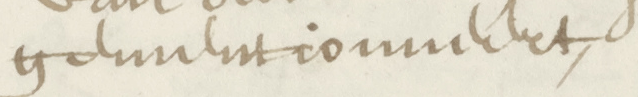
gementionneert.
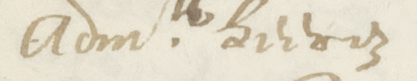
admts.heeren
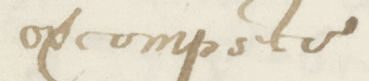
opcomste
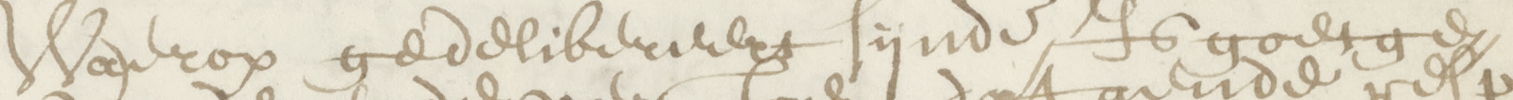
Waerop gedelibereert sijnde, Is goetge,,
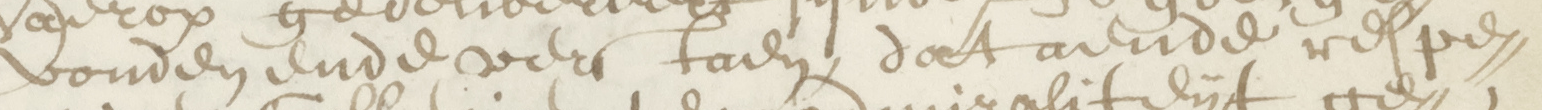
vonden ende verstaen, dat aende respe,,
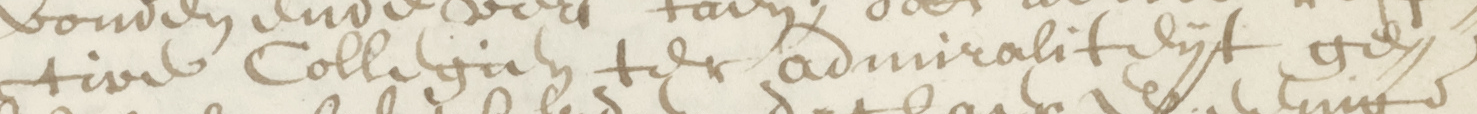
ctive Collegien ter admiraliteijt ge,,
